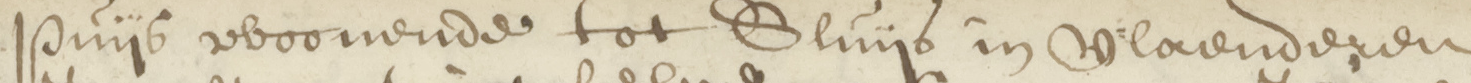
Puijs woonende tot Sluijs in Vlaenderen
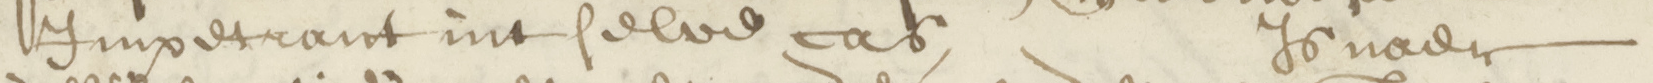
Impetrant int selve cas, Is naer
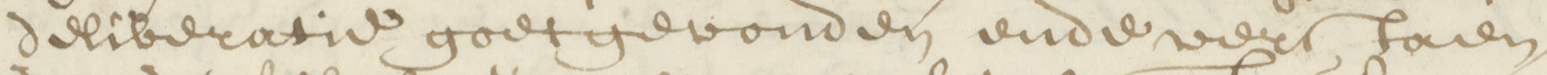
deliberatie goetgevonden ende verstaen,
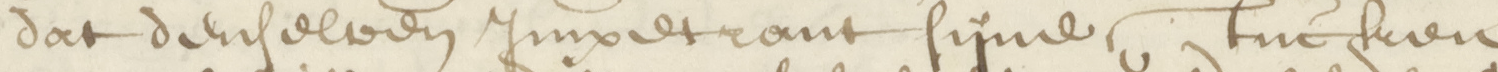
dat denselven Impetrant sijne stucken
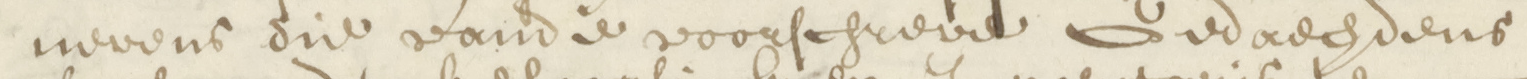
nevens die vande voorschreve Gedaechdens
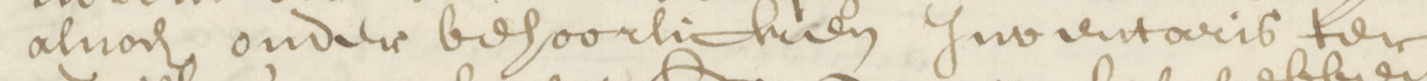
alnoch onder behoorlicken Inventaris ter
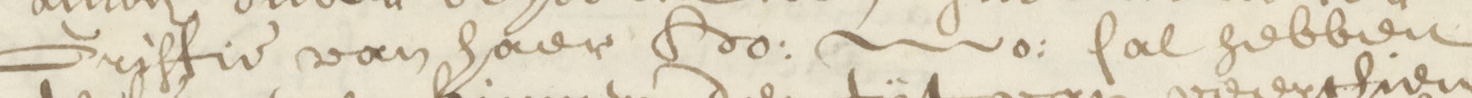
Griffie van haer Ho:Mo: sal hebben
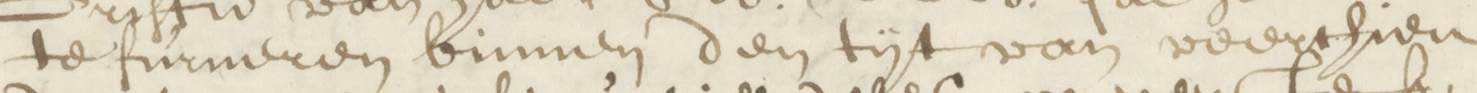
te furneren binnen den tijt van veerthien
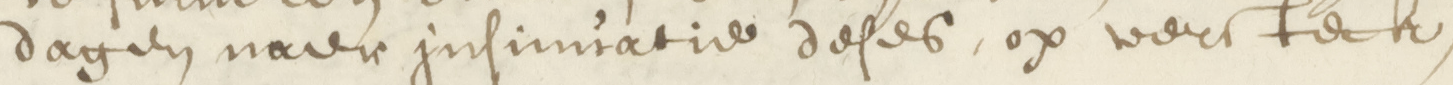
dagen naer insinuatie deses, op versteck.
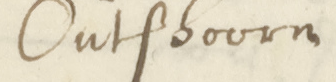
Outshoorn
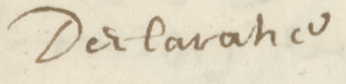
Declaratie
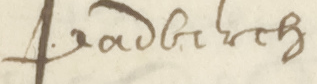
Padberch
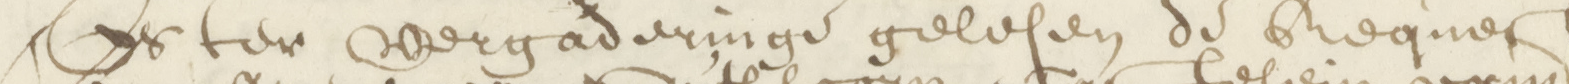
Is ter Vergaderinge gelesen de Requeste
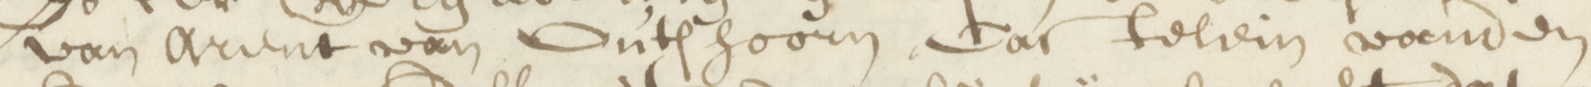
van Arent van Outshoorn, Castelein vanden
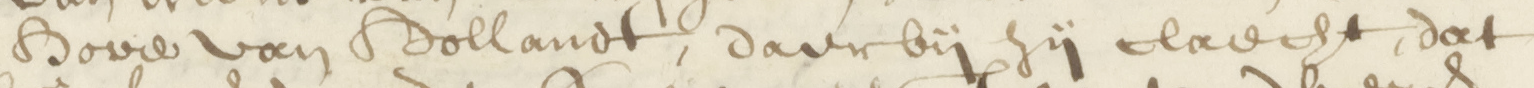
Hove van Hollandt, daerbij hij claecht, dat
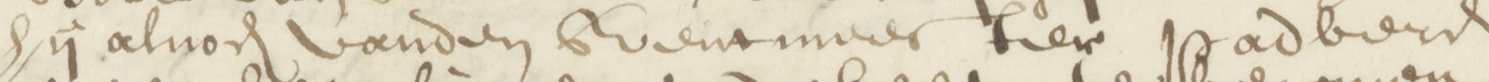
hij alnoch vanden Rentmeester Padberch
